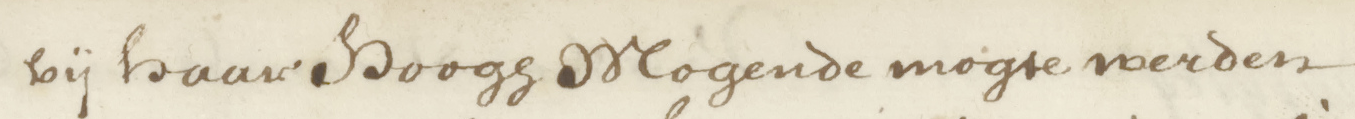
bij haar Hoogh Mogende mogte werden
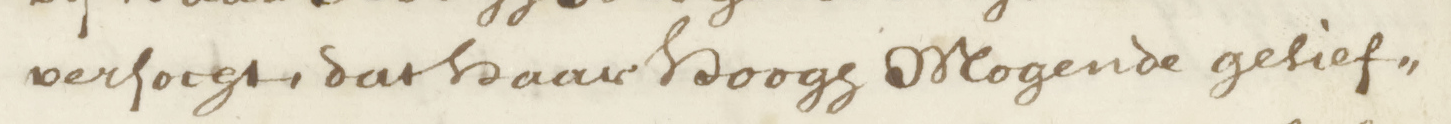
versocht dat haar Hoogh Mogende gelief„
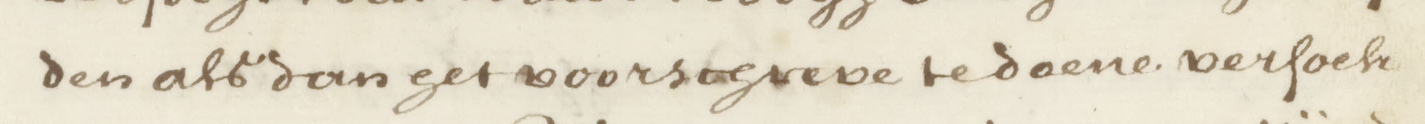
den als dan het voorschreve te doene versoek
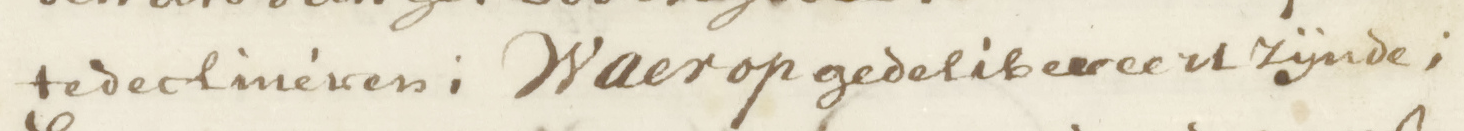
te declineren: Waerop gedelibereert zijnde;
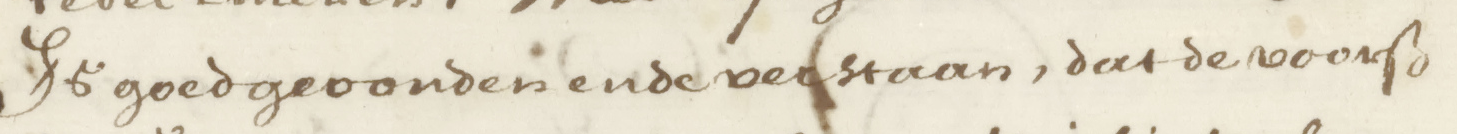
Is goedgevonden ende verstaan, dat de voors
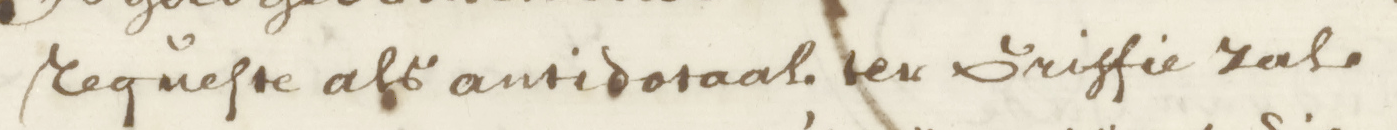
requeste als antidotaal ter Griffie zal
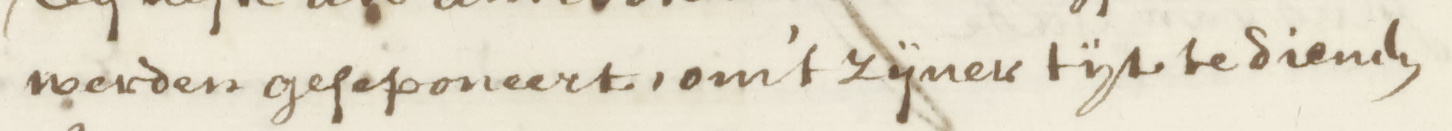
werden geseponeert, om 't zijner tijt te dienen
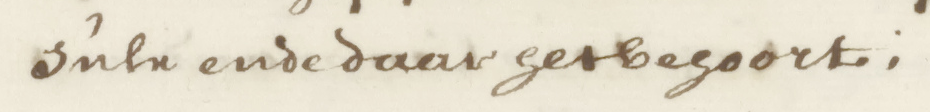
sulx ende daar het behoort:
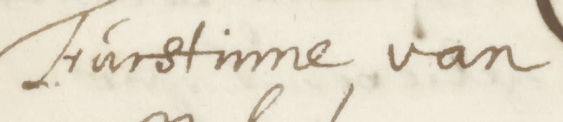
Furstinne van
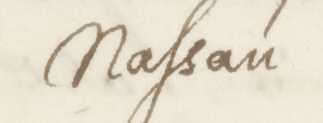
Nassau
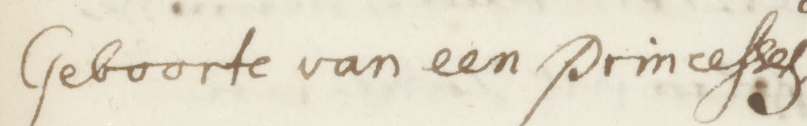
Geboorte van een Princesse
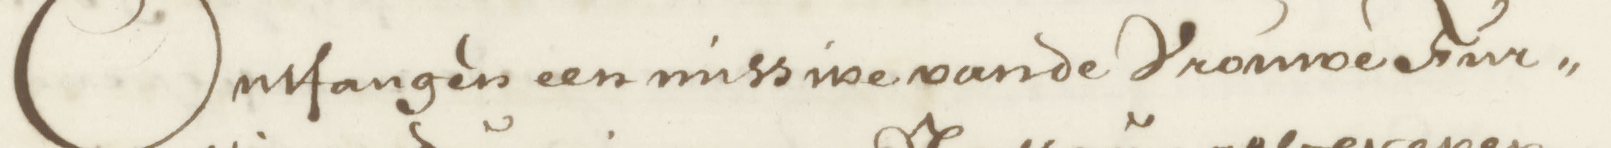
Ontfangen een missive vande Vrouwe Fur„
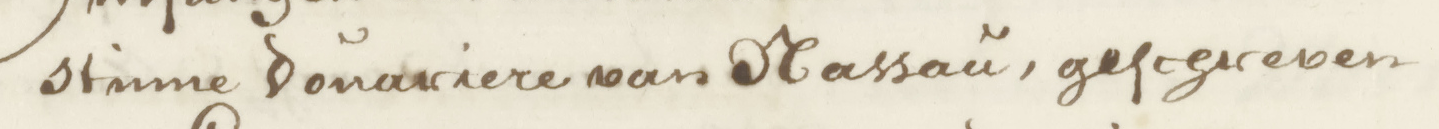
stinne douariere van Nassau, geschreven
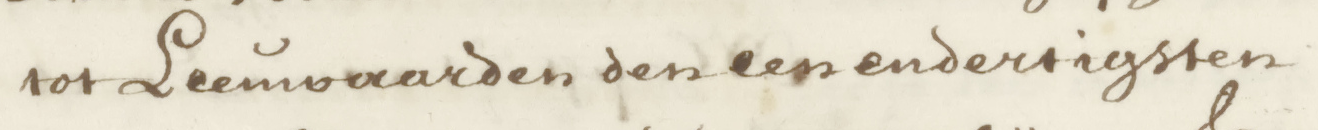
tot Leeuwaarden den een endertigsten
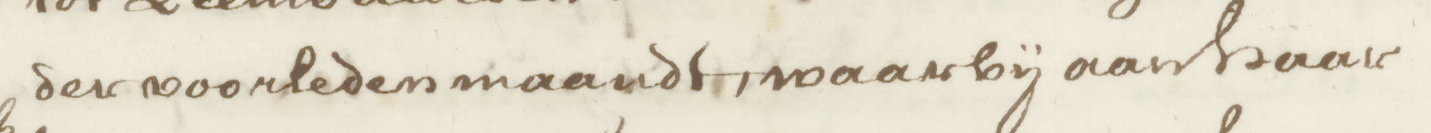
der voorleden maandt, waarbij aan haar
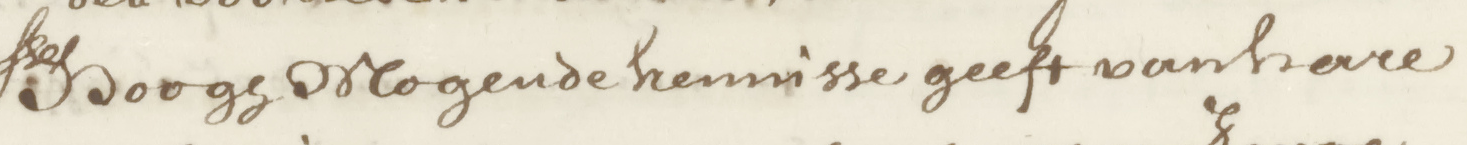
Hoogh Mogende kennisse heeft van hare
